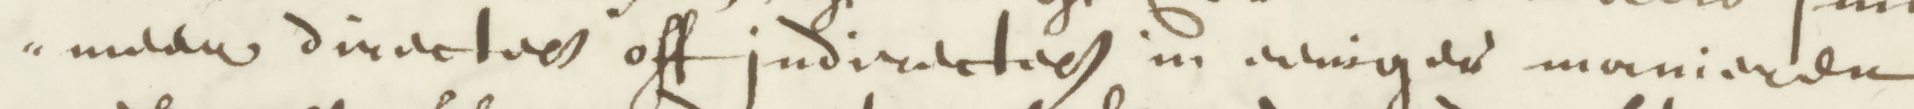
„meer directel oft indirectel in eeniger manieren
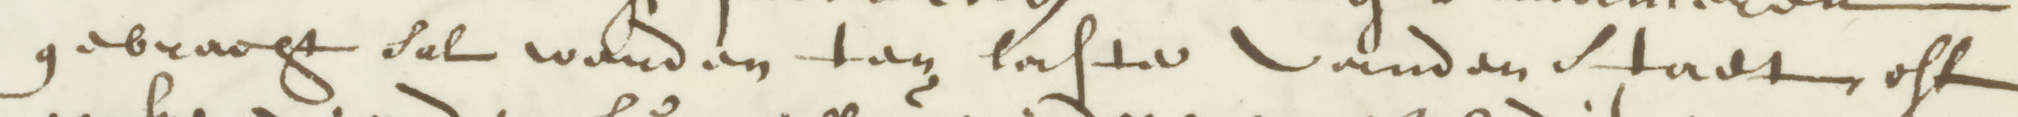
gebracht sal werden ten laste vanden Staet, off
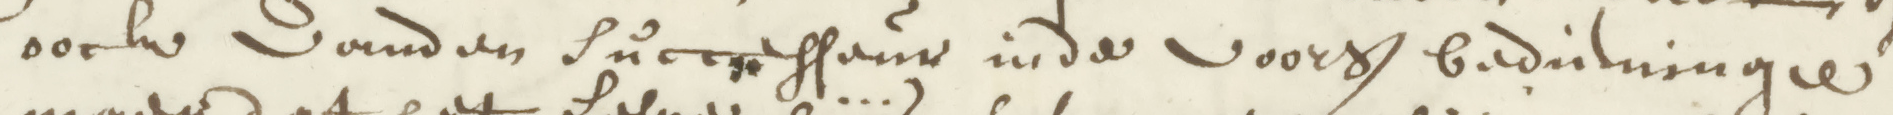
oock vanden successeur inde voors bedieninge
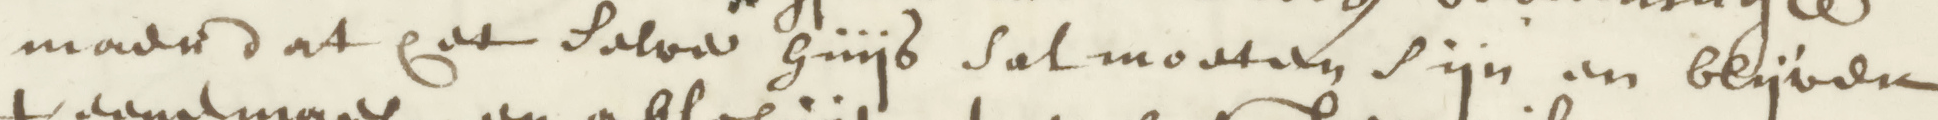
maer dat het selve huijs sal moeten sijn en blijven
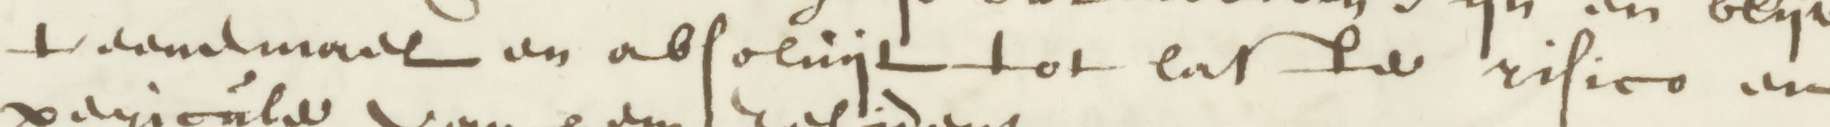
t eenemnael en absoluijt tot laste risico en
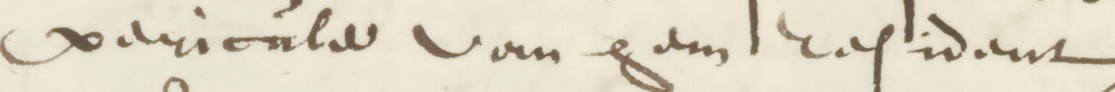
pericule van hem resident
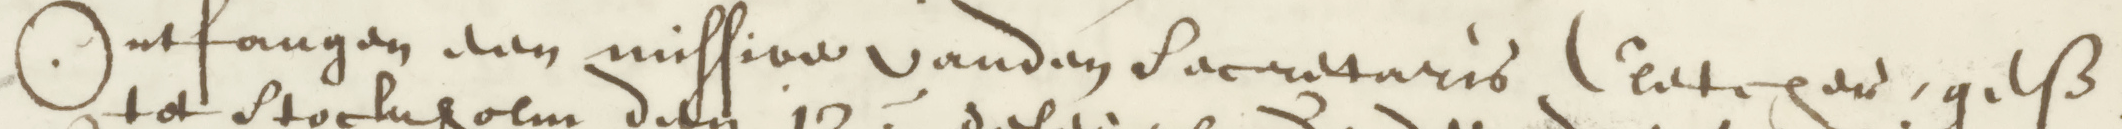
Ontfangen een missive vanden Secretaris Cletcher, ges.
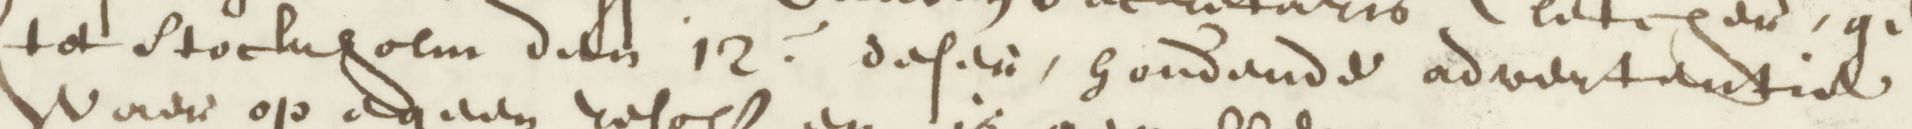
tot Stockholm den 12e. desen, houdende advertentie
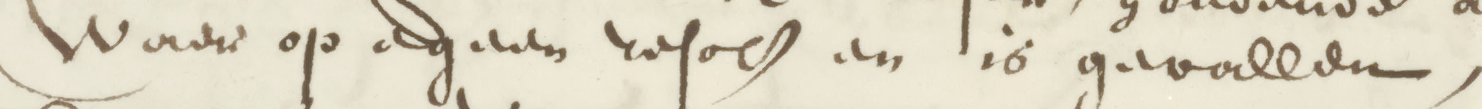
Waerop egeen resol en is gevallen
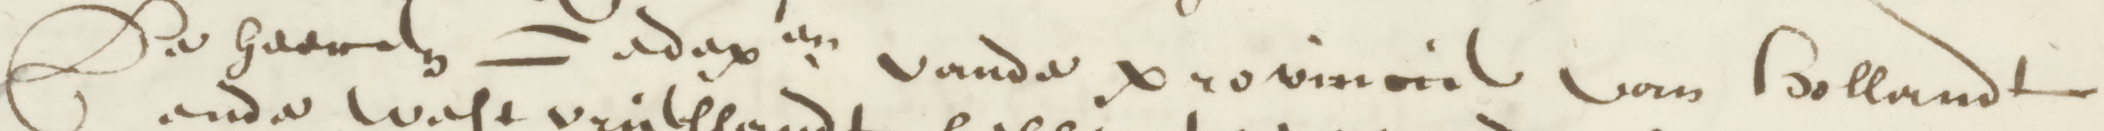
De heeren Gedepen vande provincie van Hollandt
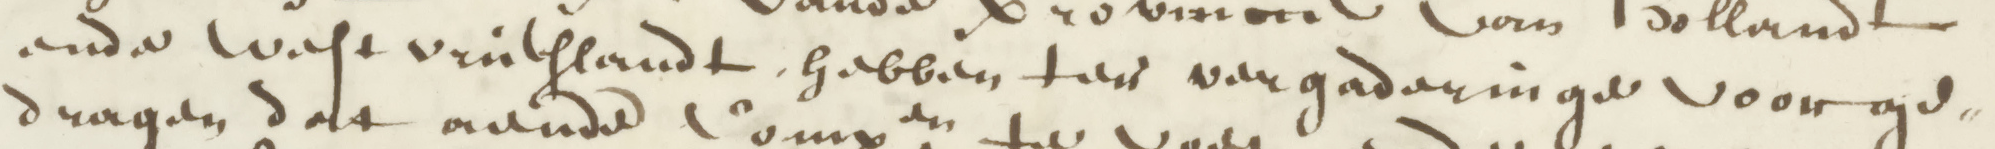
ende Westvrieslandt, hebben ter vergaderinge voorge„
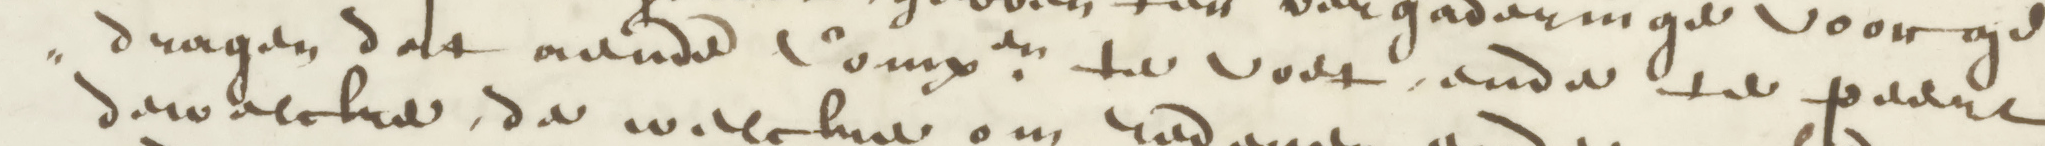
,,dragen dat aende Compen. te voet ende te peert
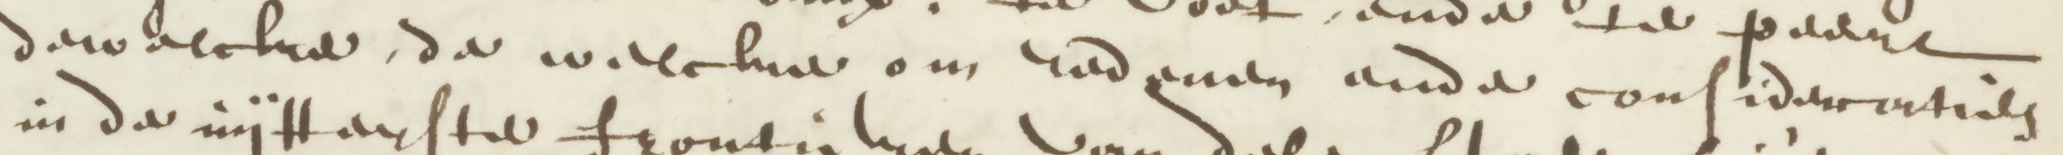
dewelcke, de welcke om redenen ende consideratien
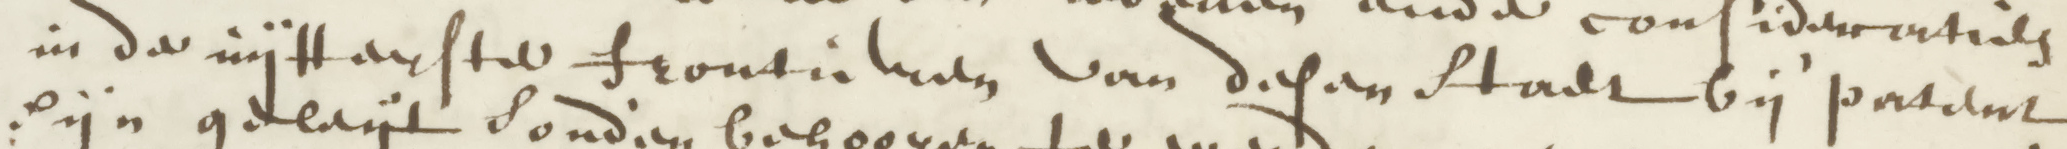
in de uijtterste frontieren van desen Staet bij patent
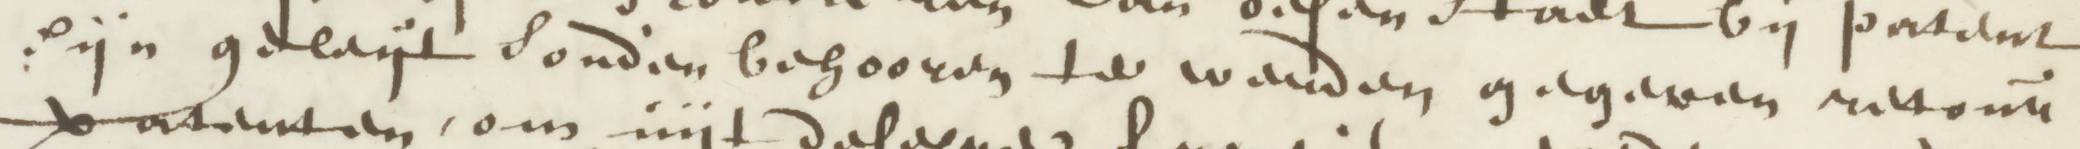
sijn geleijt souden behooren te werden gegeven retour
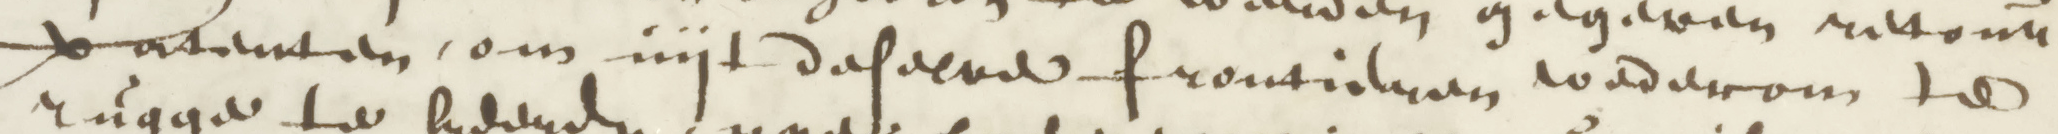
patenten, om uijt deselve frontieren wederom te
